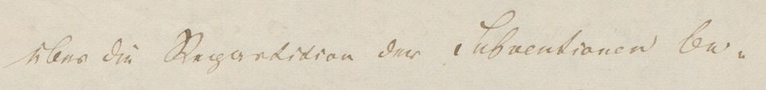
über die Repartition der Subventionen be-
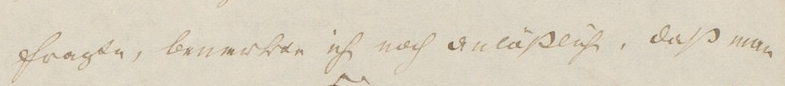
fragte, bemerkte ich noch anläßlich, daß man
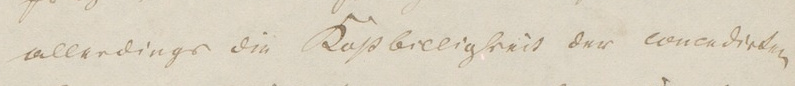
allerdings die Kostbilligkeit der concedirten
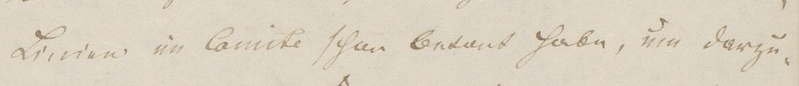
Linien im Comite schon betont habe, um darzu-
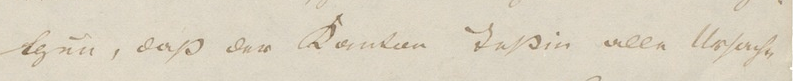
thun, daß der Kanton Teßin alle Ursache
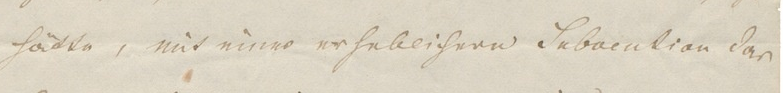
hätte, mit einer erheblichern Subvention das
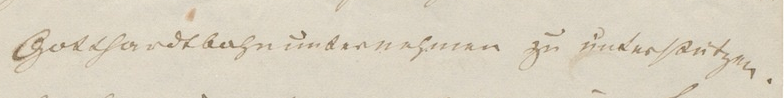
Gotthardtbahnunternehmen zu unterstützen.
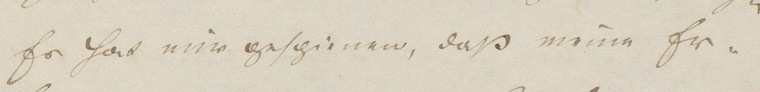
Er hat mir geschienen, daß meine Er-
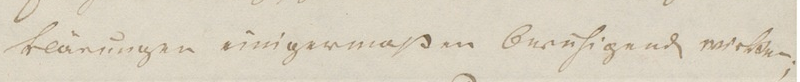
klärungen einigermaßen beruhigend wirkten;
